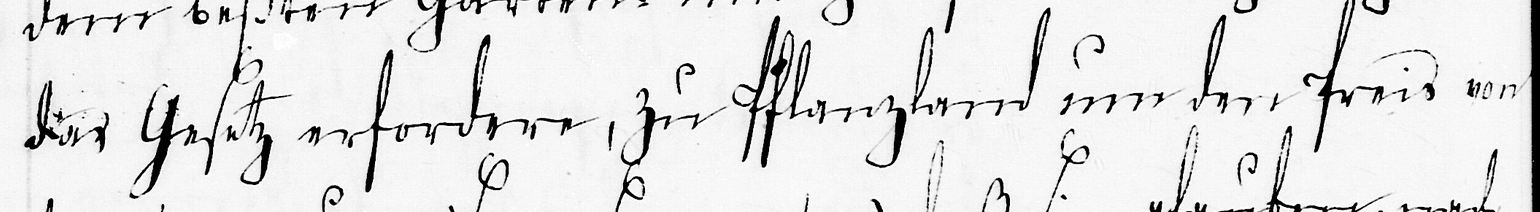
das Gesetz erfordere, zu Pflanzland um den Preis von
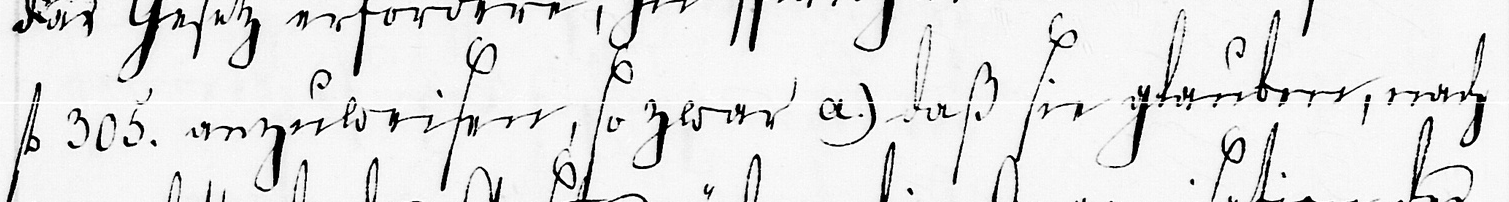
fl. 305. anzuweisen, so zwar a.) daß sie glauben, nach
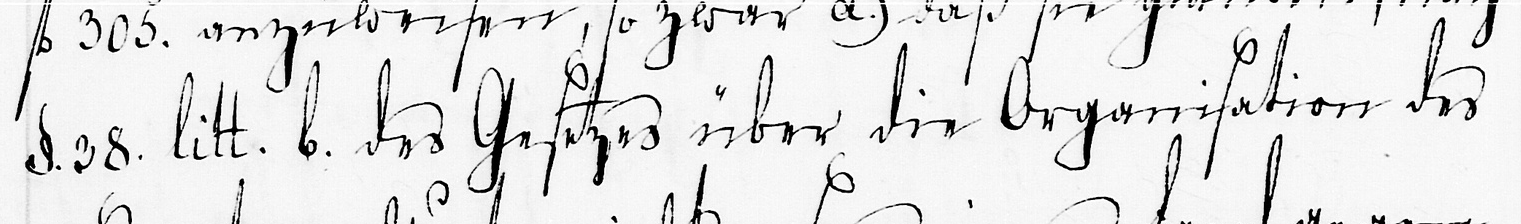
38. litt. b. des Gesetzes über die Organisation des
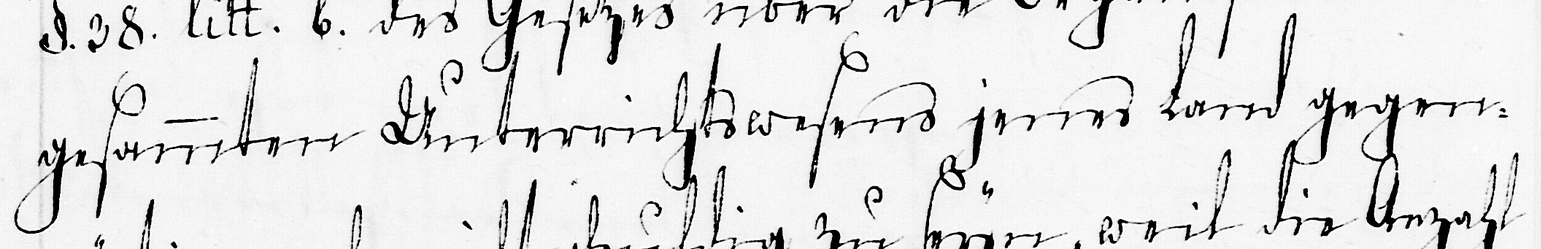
gesammten Unterrichtswesens jenes Land gegen¬
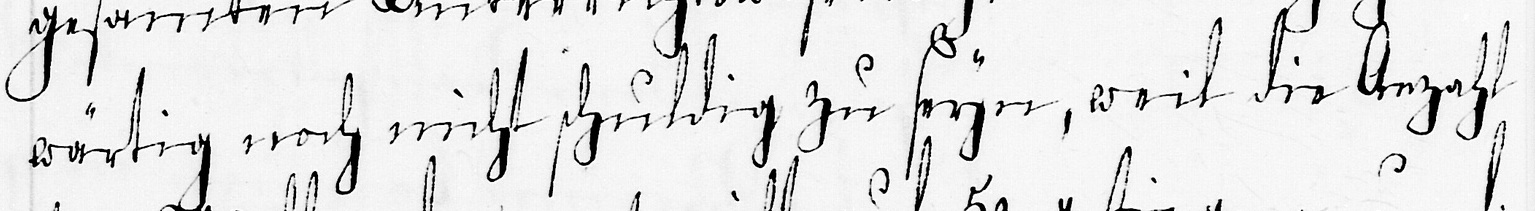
wärtig noch nicht schuldig zu seyn, weil die Anzahl
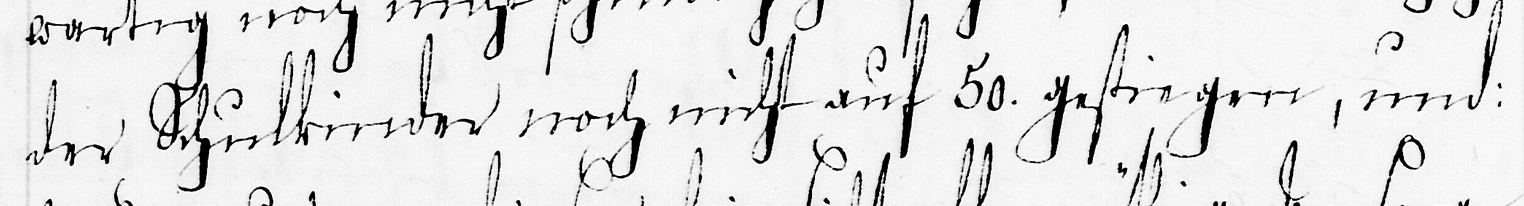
der Schulkinder noch nicht auf 50. gestiegen, und:
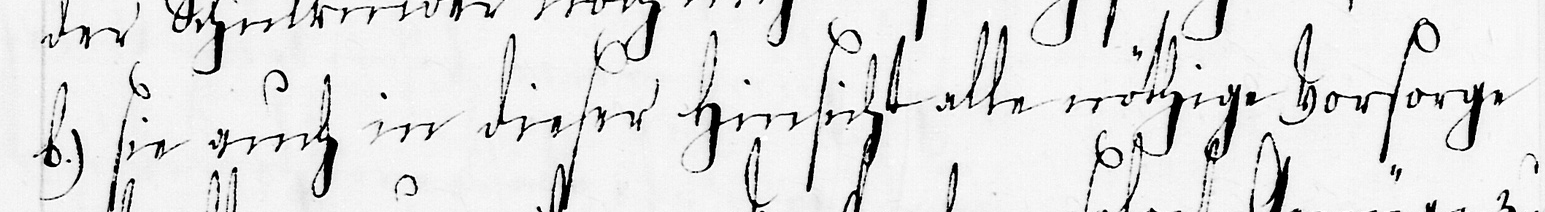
b.) sie auch in dieser Hinsicht alle nöthige Vorsorge
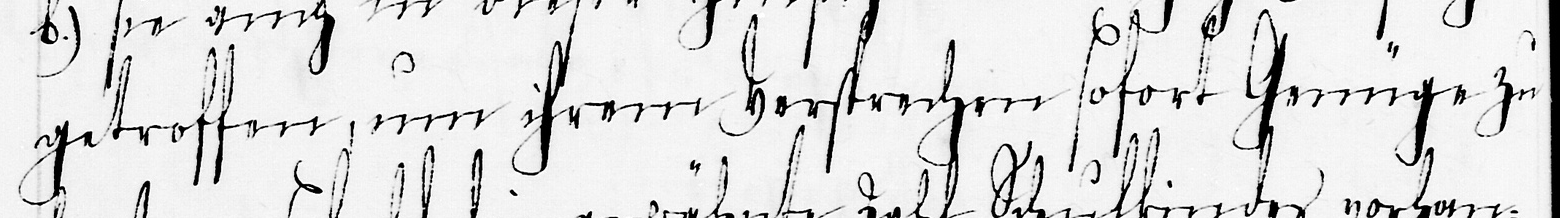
getroffen, um ihrem Versprechen sofort Genüge zu
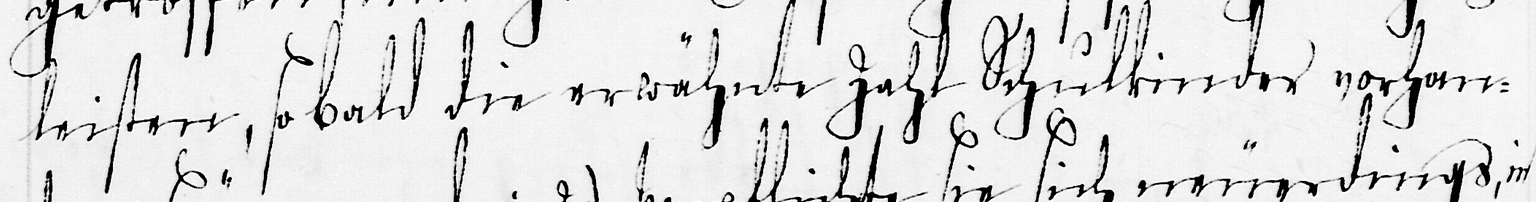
leisten, sobald die erwähnte Zahl Schulkinder vorhan¬
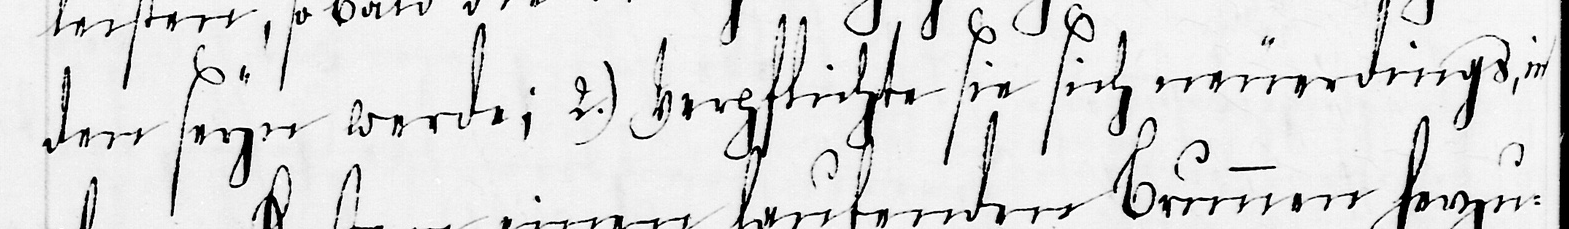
den seyn werde; 2.) Verpflichte sie sich neuerdings, in
